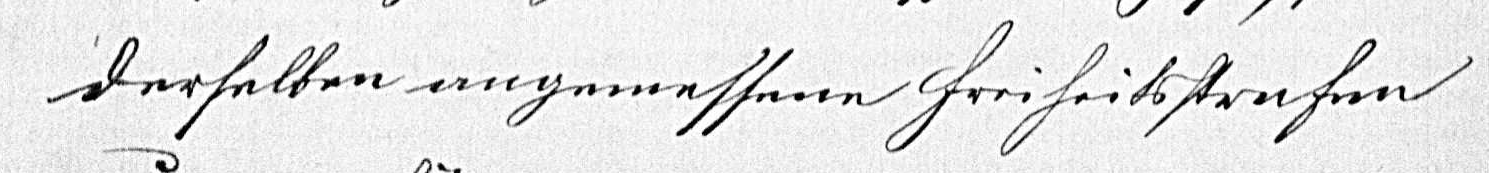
derselben angemessene Freiheitsstrafen
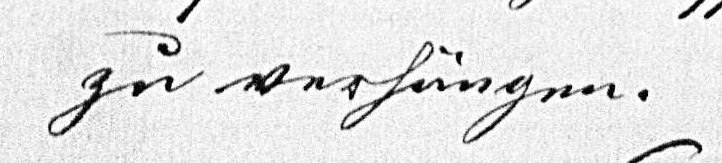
zu verhängen.
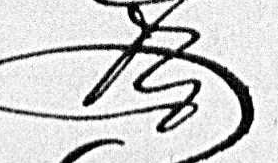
xx
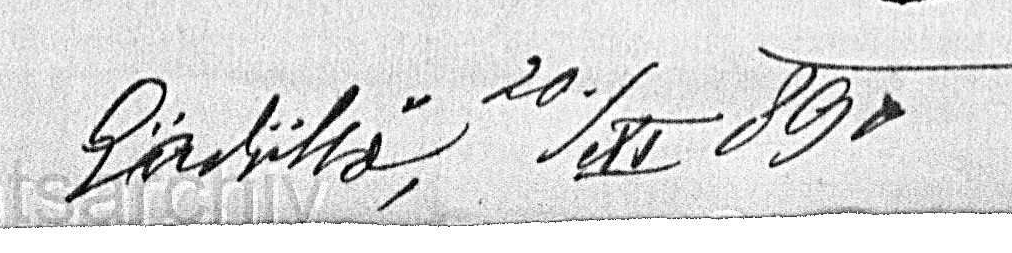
Gxx, 20./XI 890
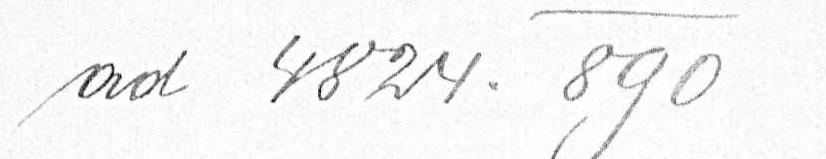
ad 4824. 890
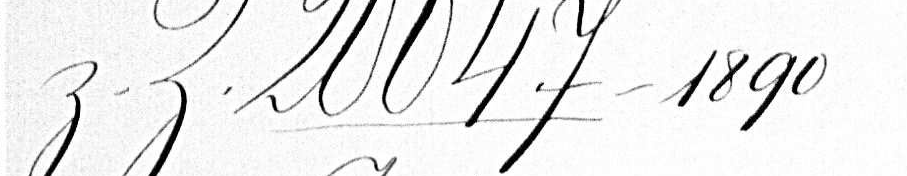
z. Z. 20047-1890
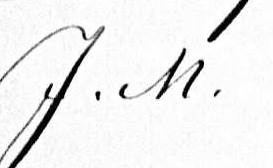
J. M.
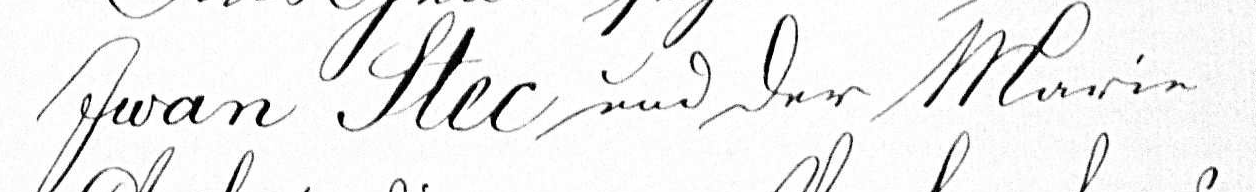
Jwan Stec und der Marie
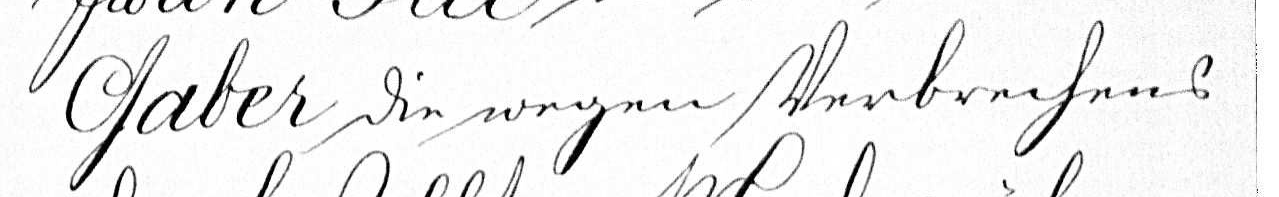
Gaber die wegen Verbrechens
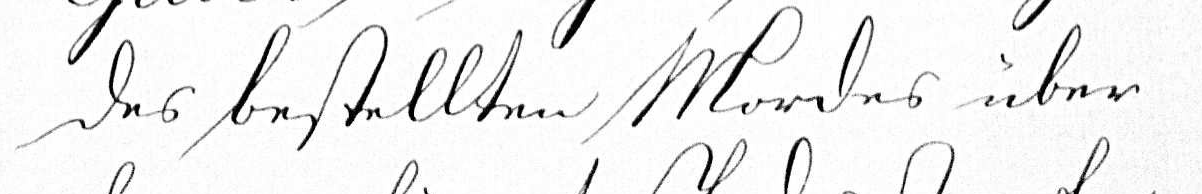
des bestellten Mordes über
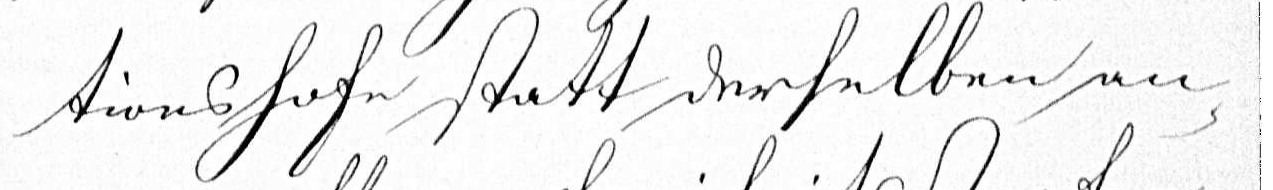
tionshofe statt derselben an¬
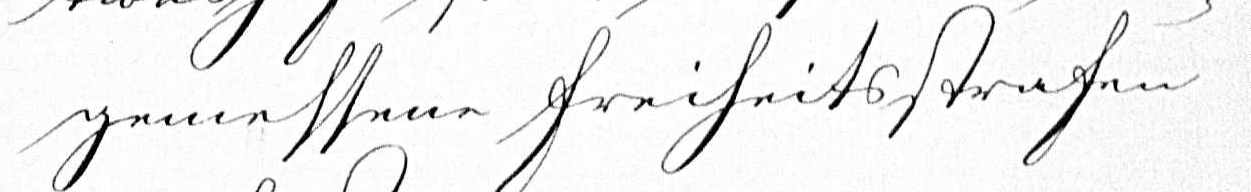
gemessene Freiheitsstrafen
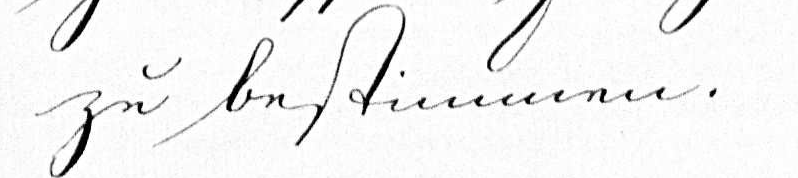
zu bestimmen.
